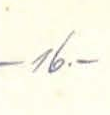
16.
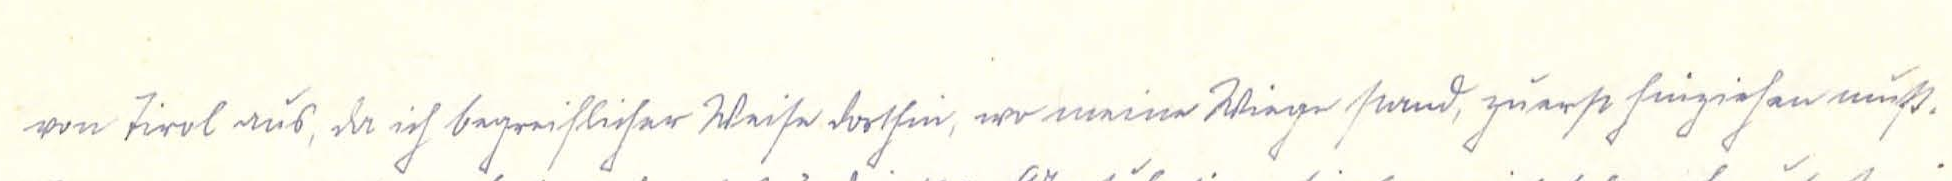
von Tirol aus da ich begreiflicher Weise dorthin, wo meine Wiede stand, zuerst hinziehen muß.
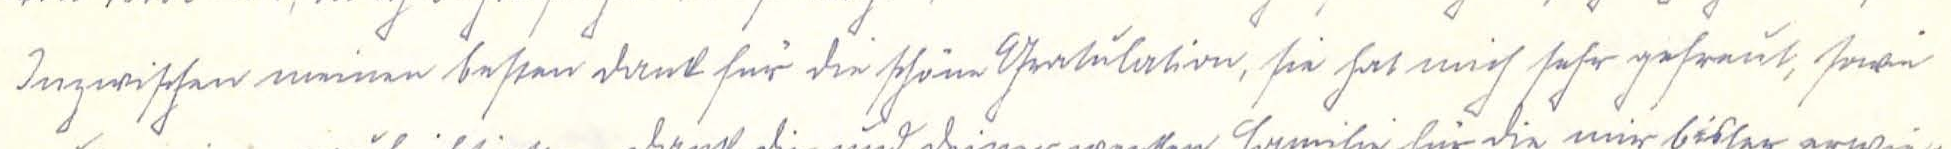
Inzwischen meinen besten Dank für die schöne Gratulation, sie hat mich sehr gefreut, sowie
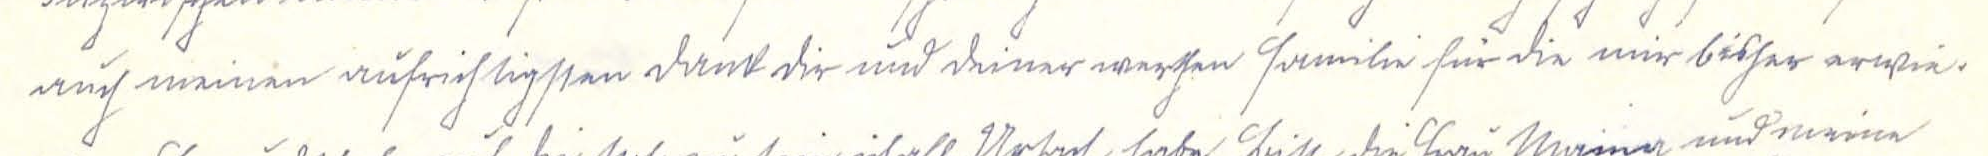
auch meinen aufrichtigen Dank dir und deiner ganzen Familie für die mir bisher erwie-
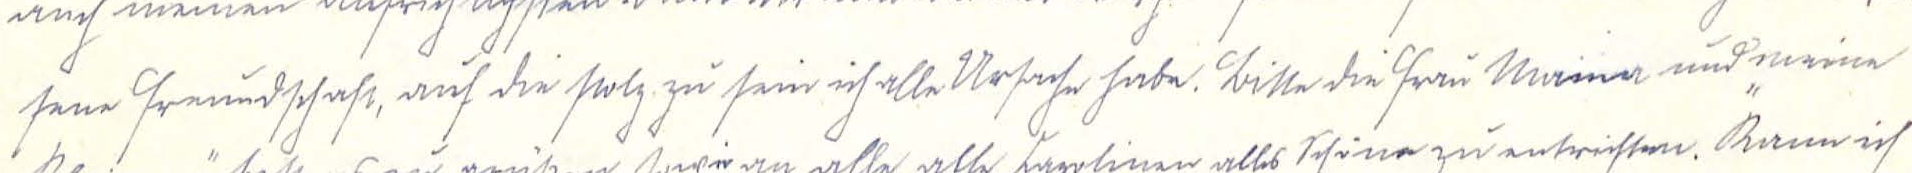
sene Freundschaft, auf die stolz zu sein ich alle Ursache habe. Bitte die Frau Mama und "meinen
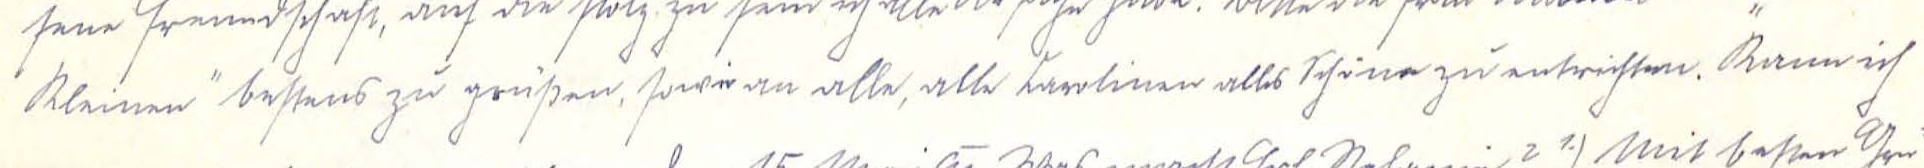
Kleinen" bestens zu grüßen, sowie an alle, alle Carolinen alles Schöne zu ausrichten. Kann ich
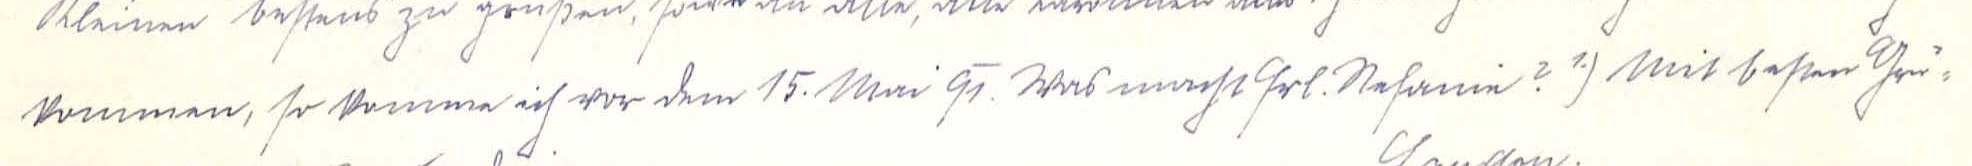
kommen, so komme ich vor dem 15. Mai 91. Was macht Frl. Stefanie? 1.) Mit besten Grü-
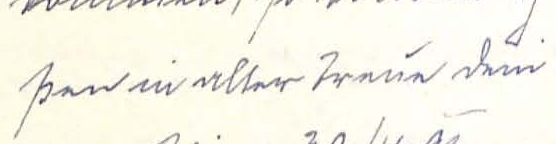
ßen in alter Treue dein
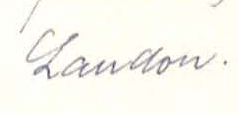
Laudon.
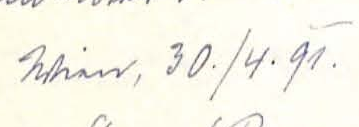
Wien, 30. / 4. 91
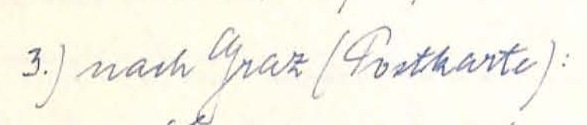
3.) nach Graz (Postkart)
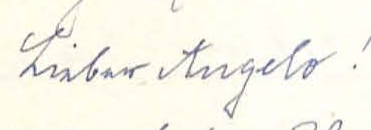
Lieber Angelo !
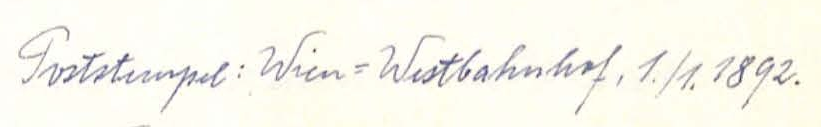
Poststempel: Wien - Westbahnhof, 1. /1. 1892
